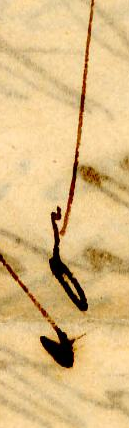To
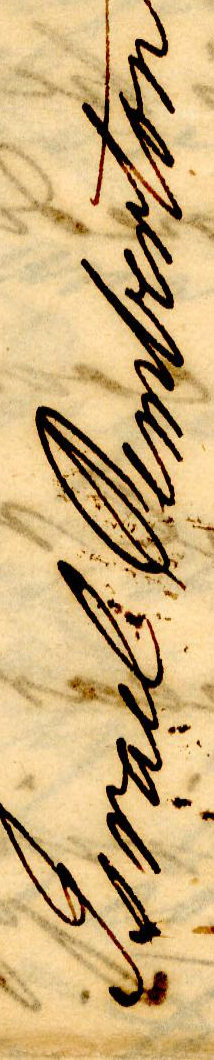Israel Pemberton
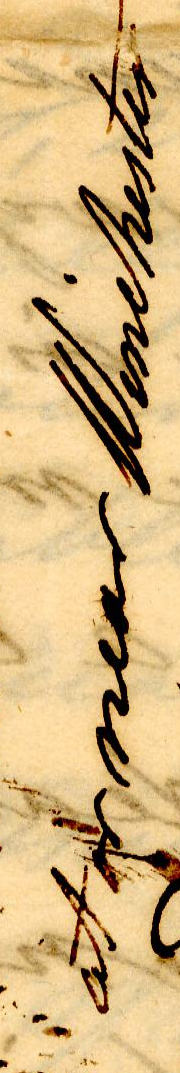at or near Winchester
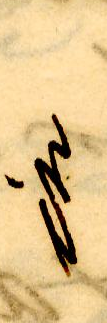in
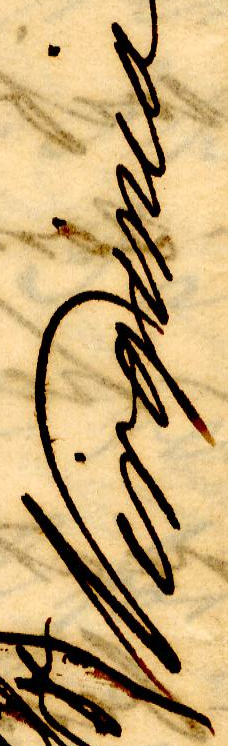Virginia
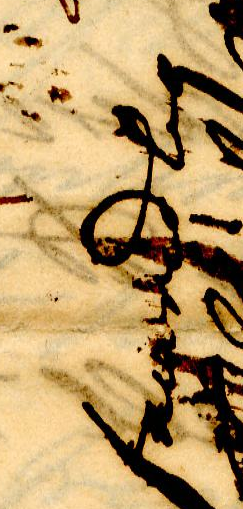favoured by
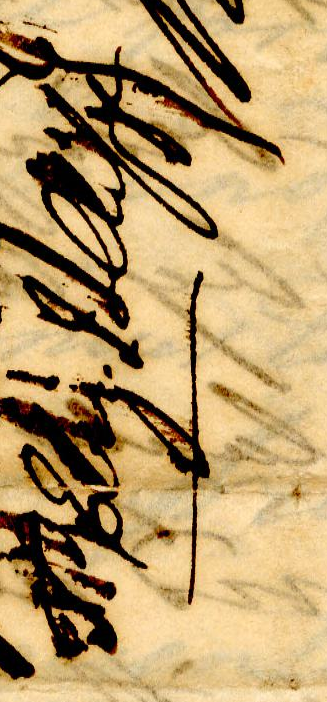F. Eliz. Jolliff
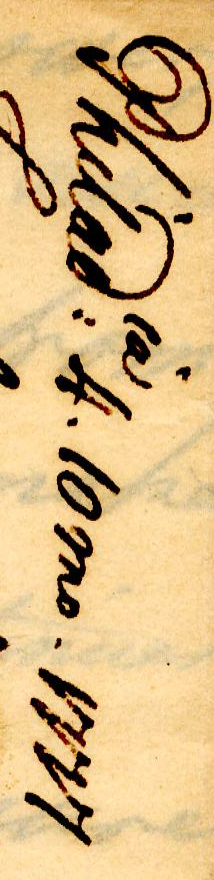Philad:^ia 4. 10mo. 1777
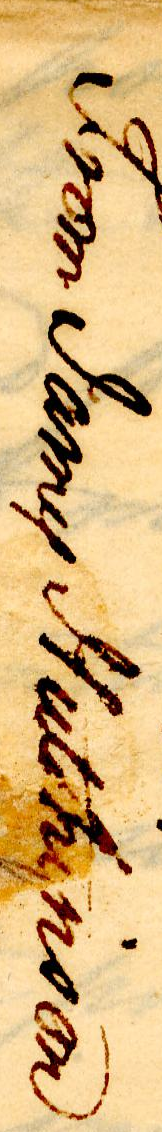From James Hutchinson
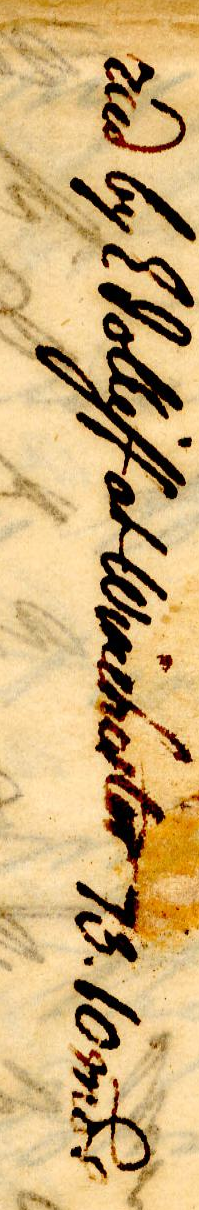recd by E Jolliff at Winchester 13. 10 mos
